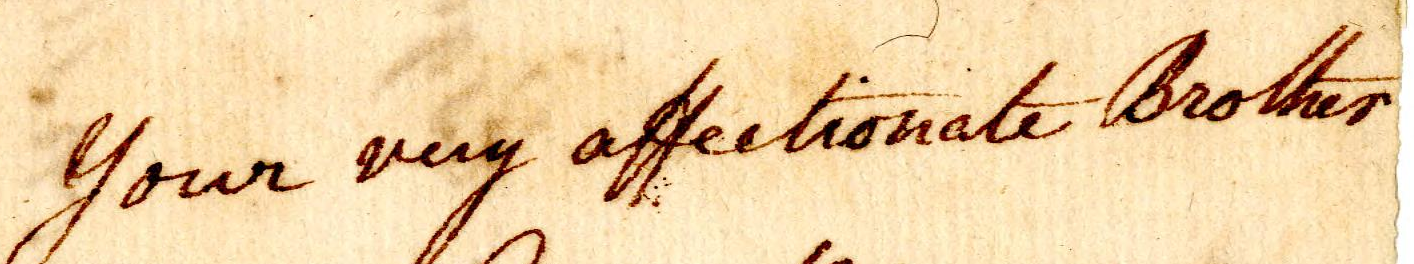Your very affectionate Brother
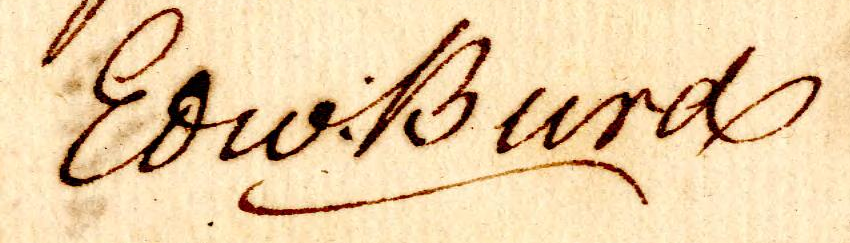Edw: Burd
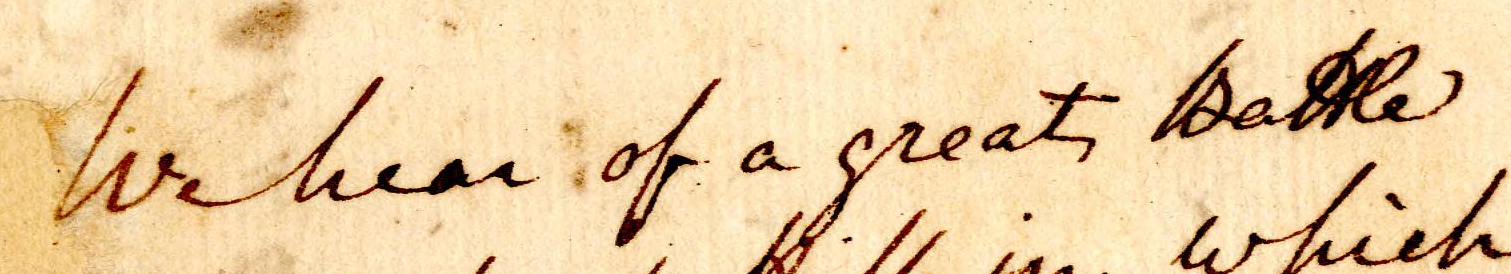We hear of a great Battle
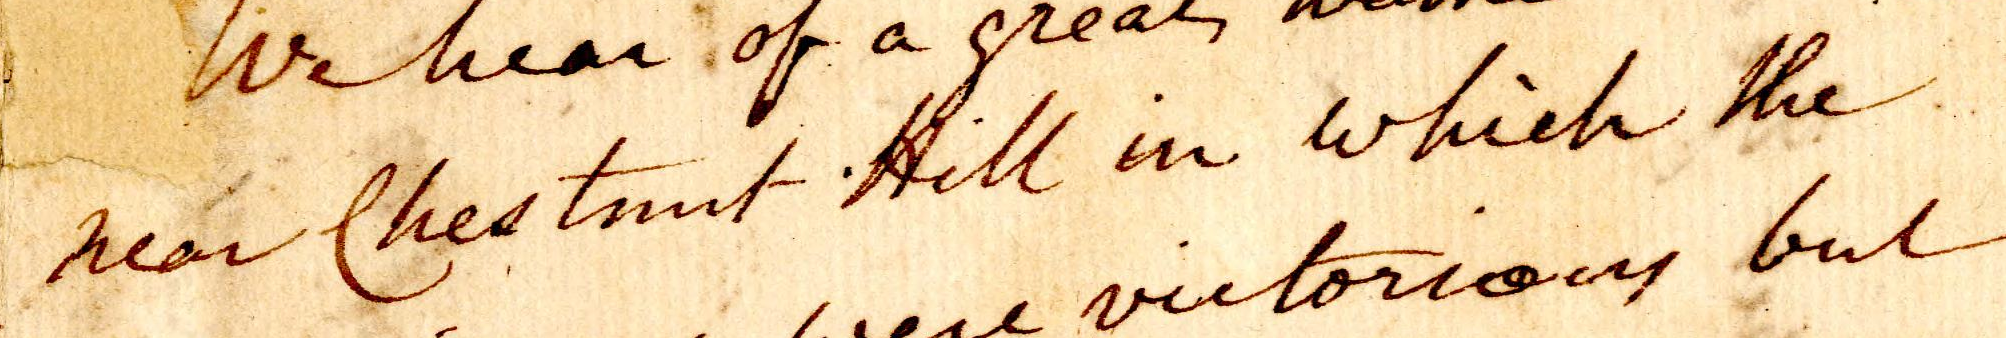near Chestnut Hill in which the
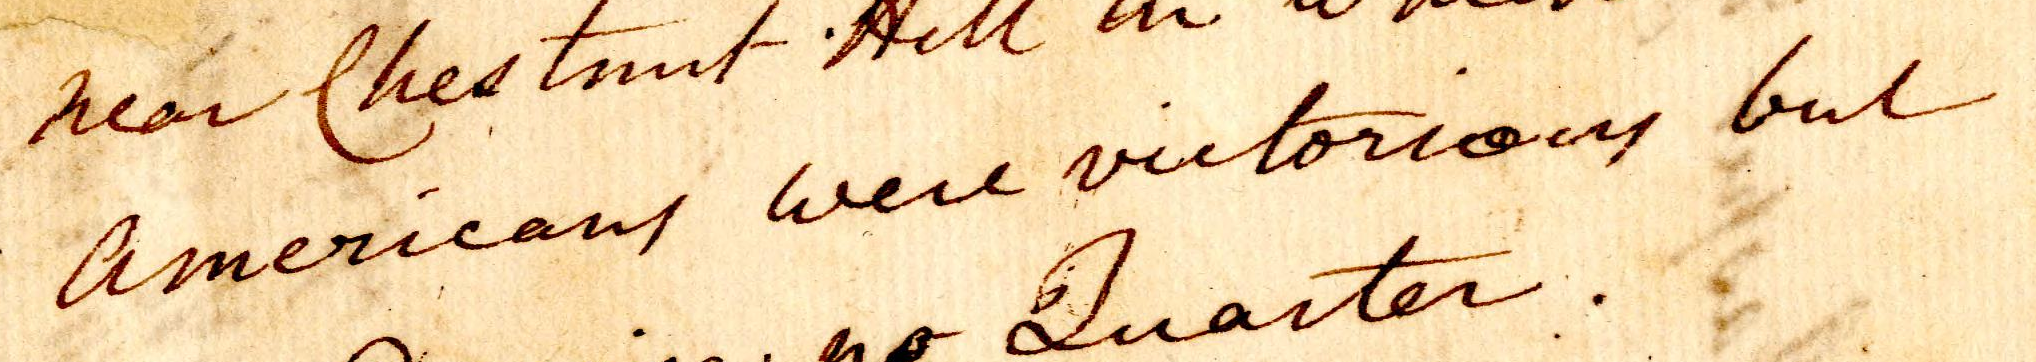Americans were victorious but
